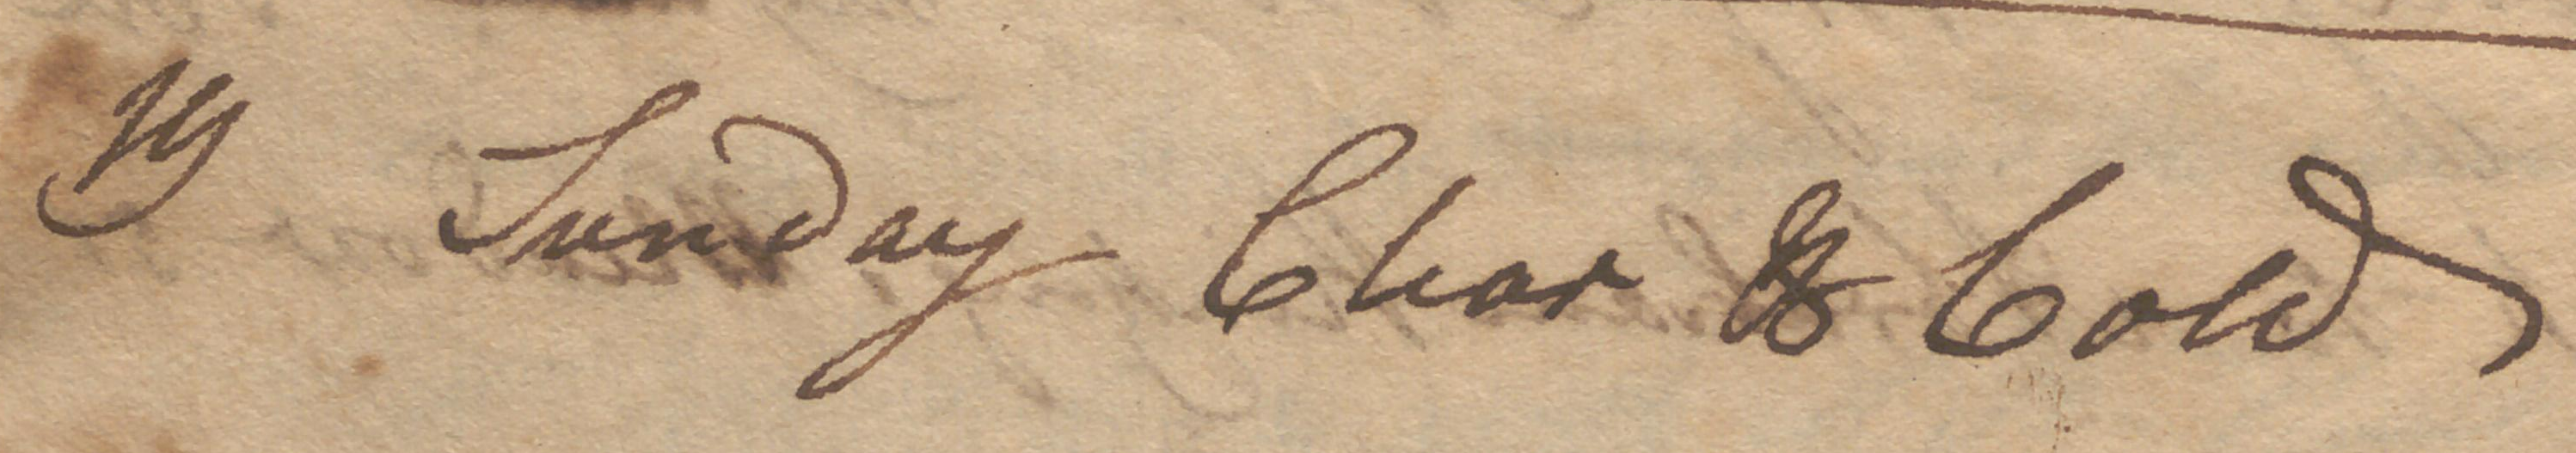19 Sunday Clear & Cold
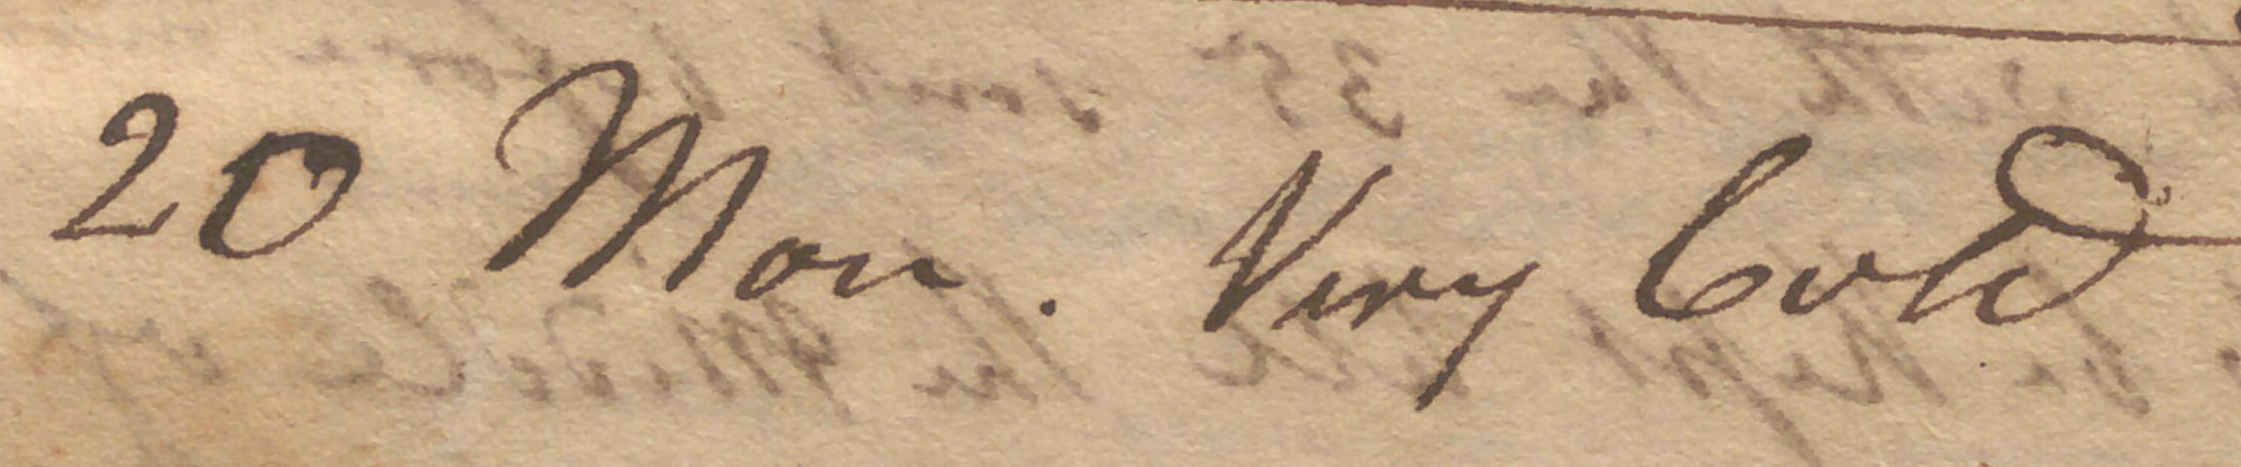20 Mon. Very Cold
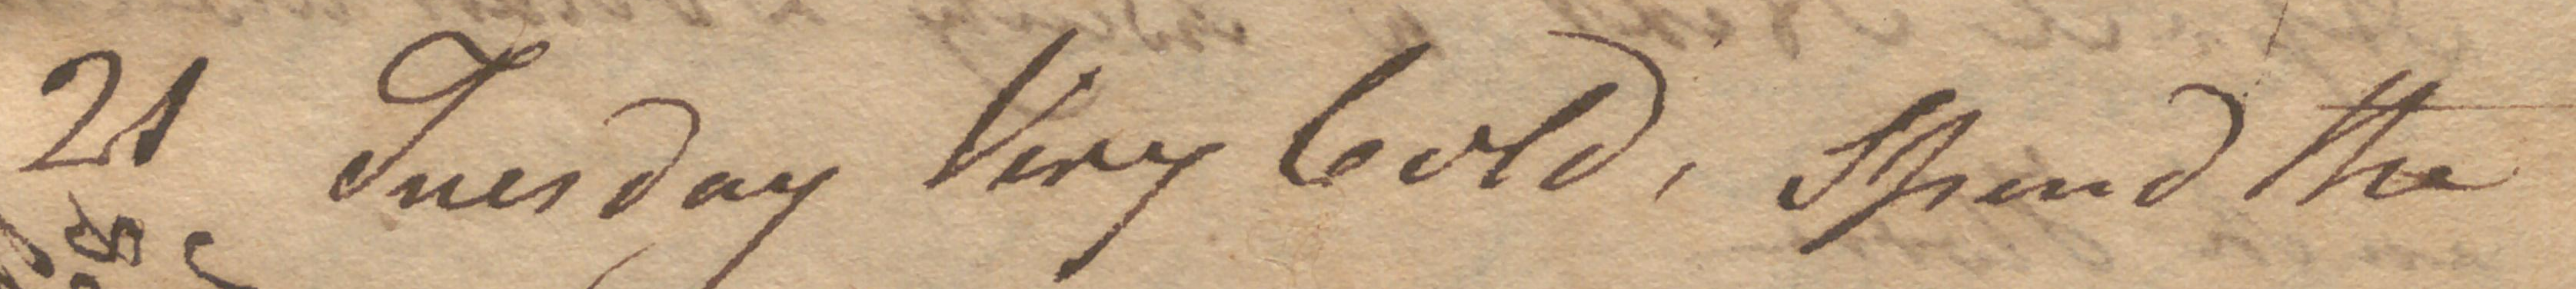21 Tuesday Very Cold, spend the
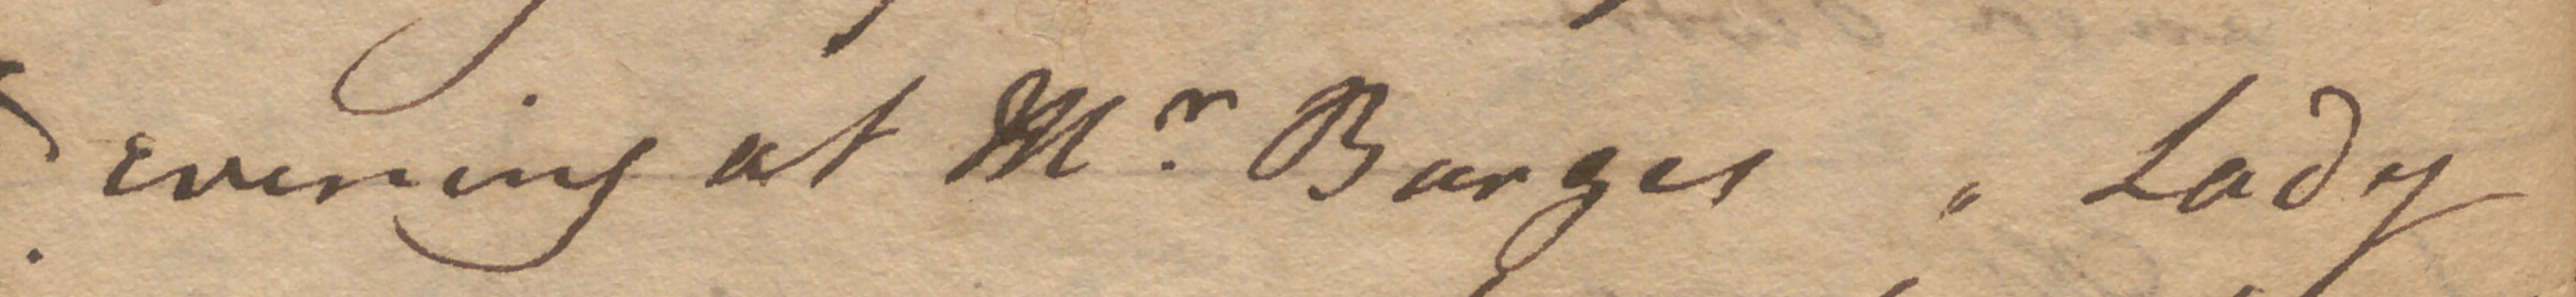evening at M^r. Barges. Lady
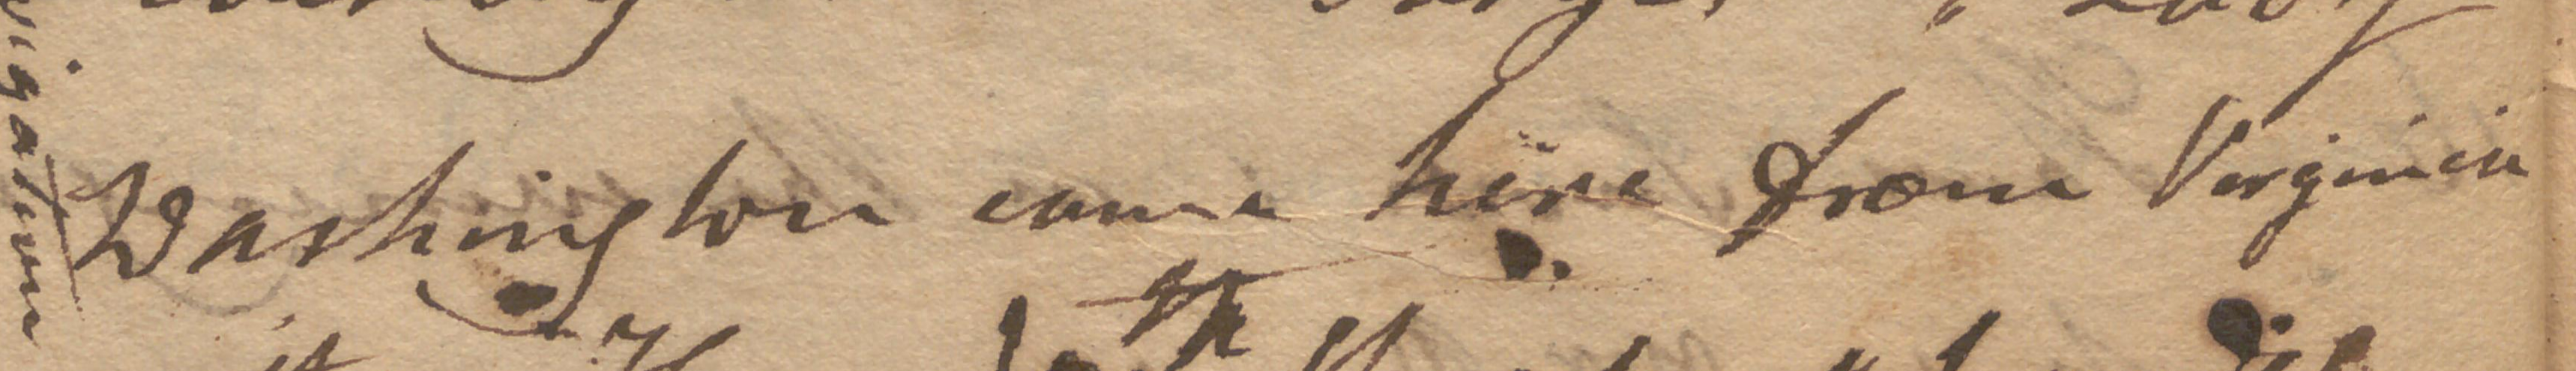Washington came here from Virginia
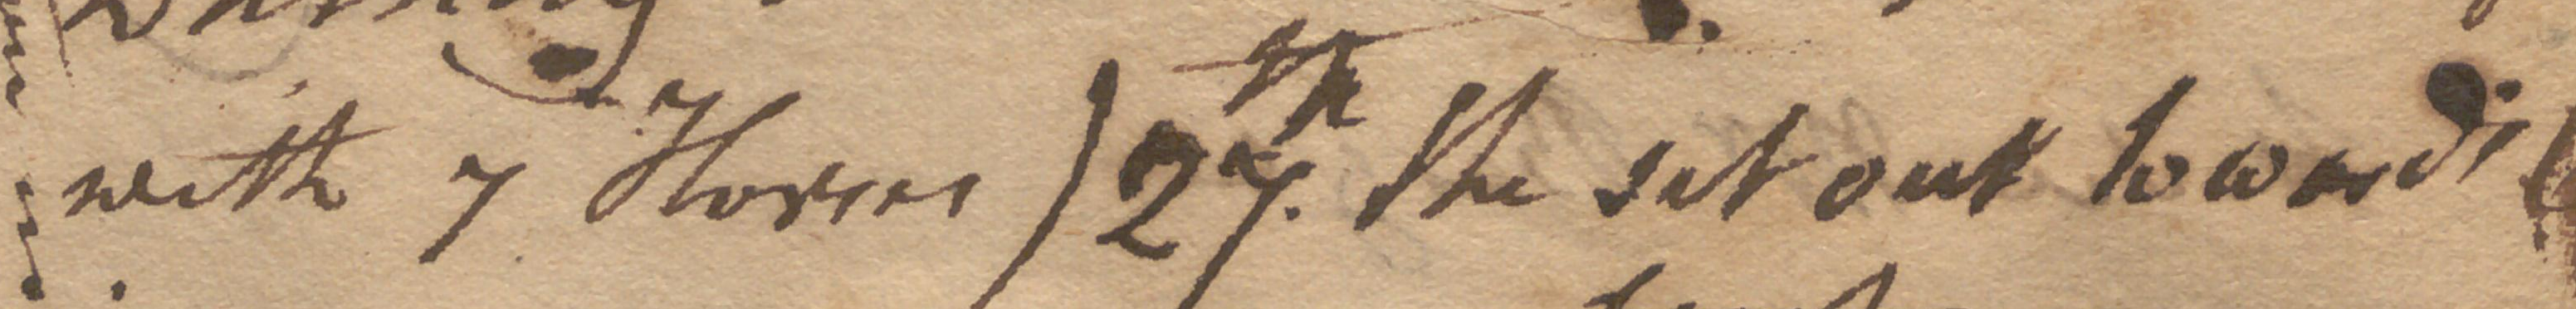with 7 Horses) 27^th. She set out towards
